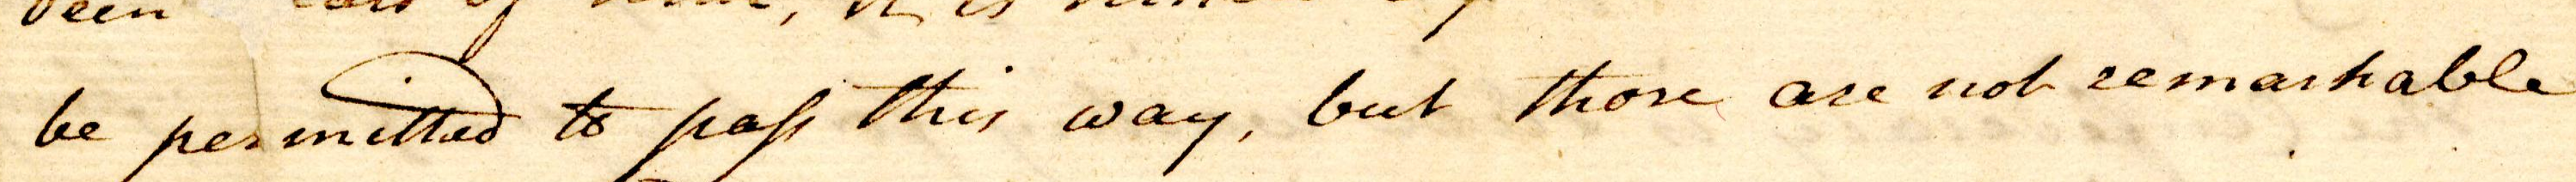be permitted to pass this way, but those are not remarkable
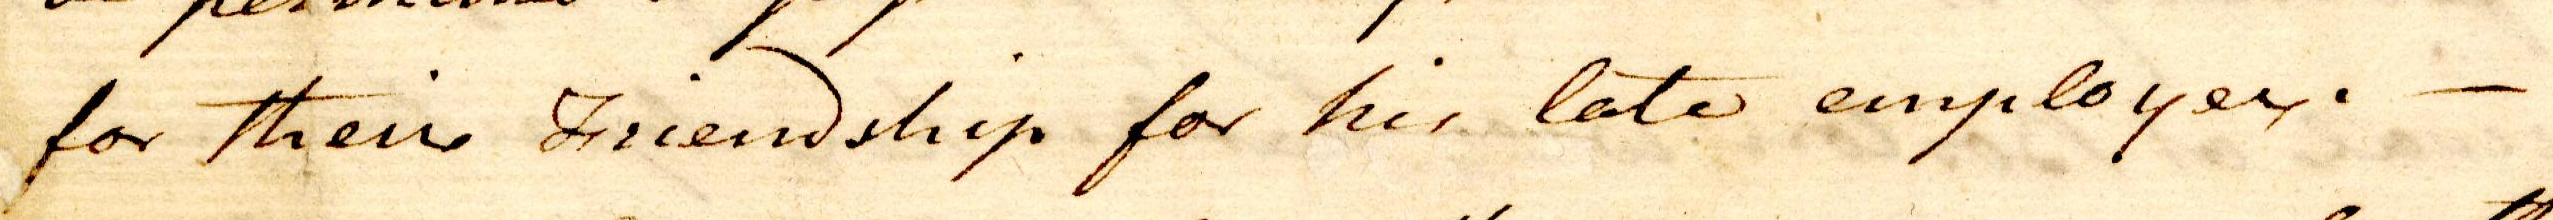for their Friendship for his late employer.-
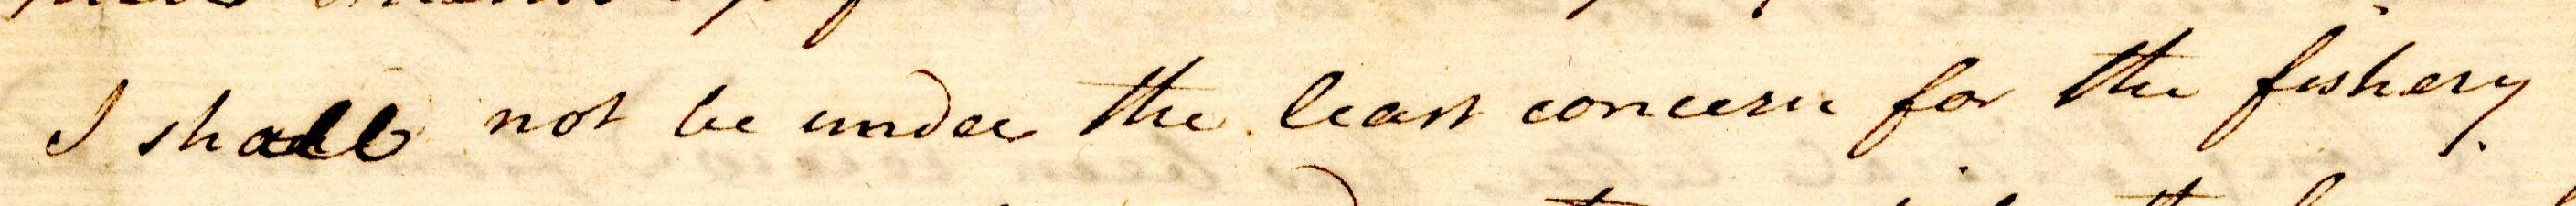I shall not be under the least concern for the fishery
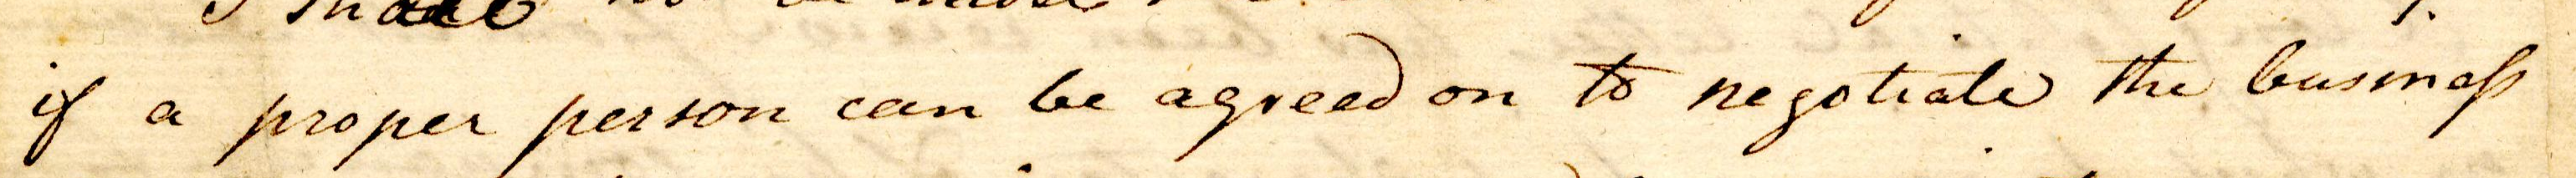if a proper person can be agreed on to negotiate the business
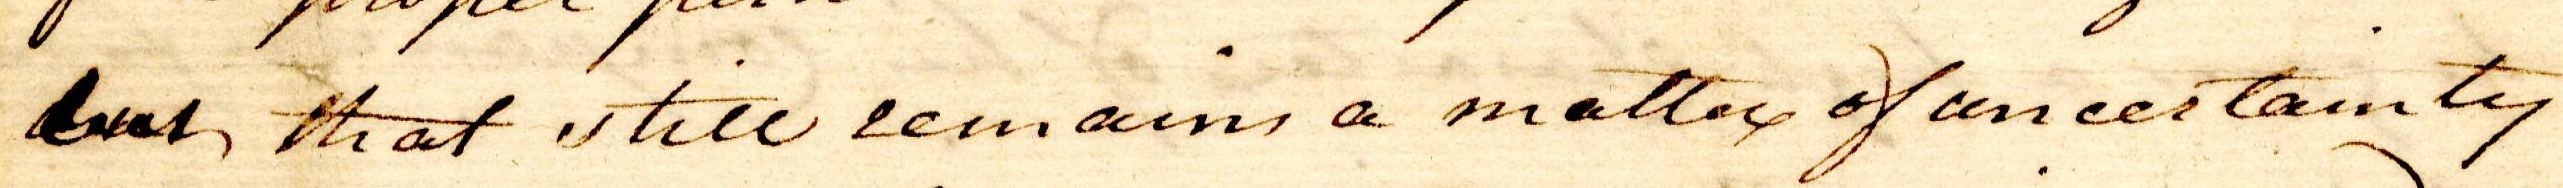[but] that still remains a matter of uncertainty
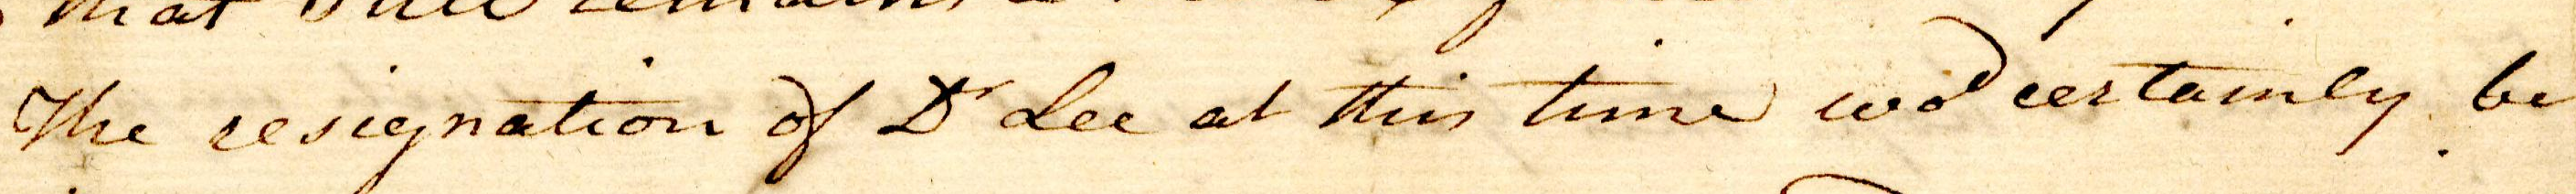The resignation of D^r Lee at this time wo^d. certainly be
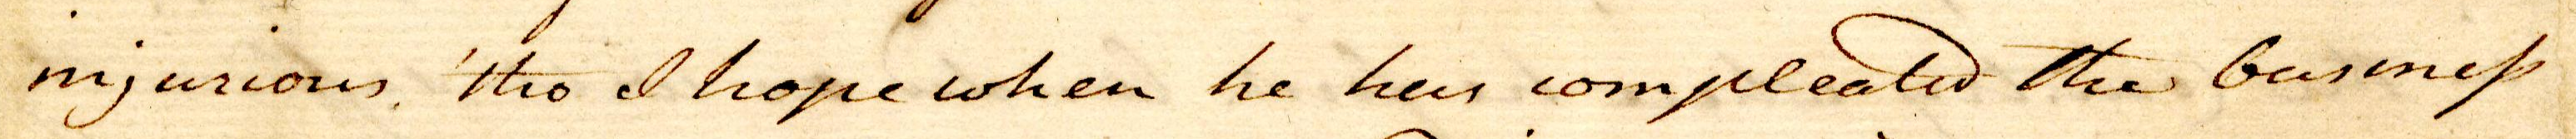injurious 'tho I hope when he has compleated the business
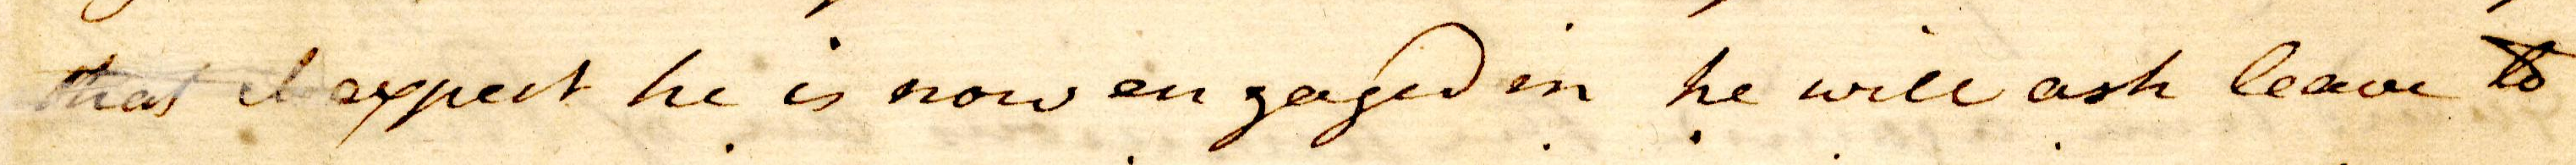that I expect he is now engaged in he will ask leave to
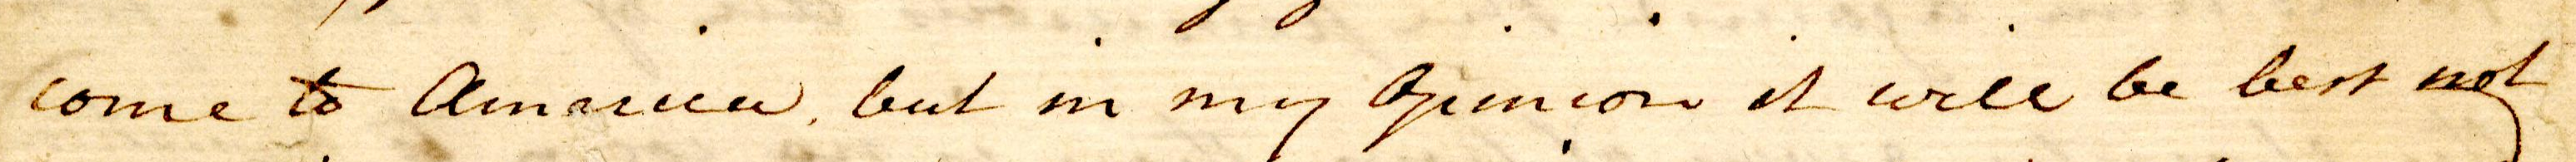come to America but in my Opinion it will be best not
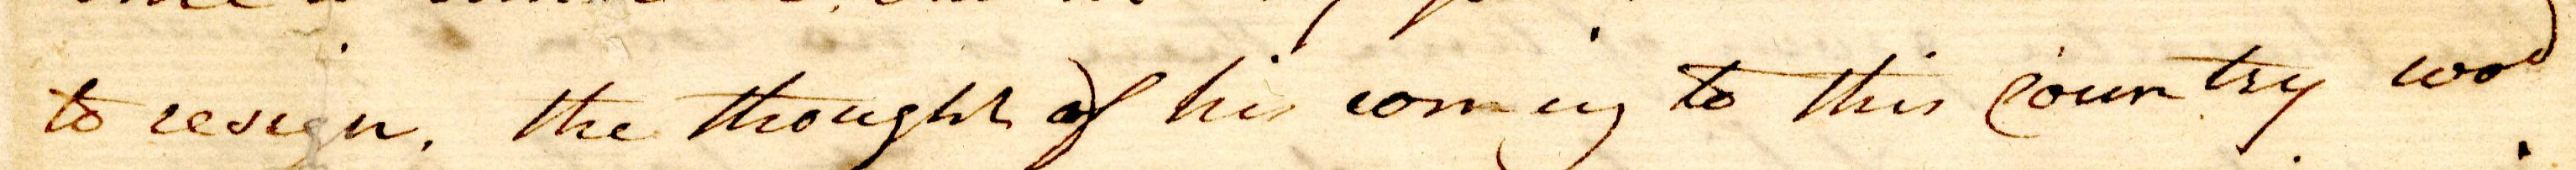to resign the thought of his come to this Country wo^d
